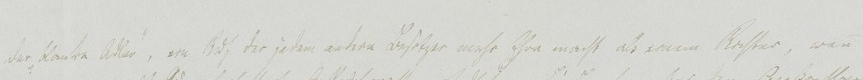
der «blanke Adler», ein Ruf der jedem andern Besitzer mehr Ehre macht als einem Richter, wenn
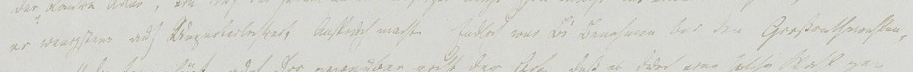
er wenigstens auf Unparteilichkeit Anspruch macht. Endlich war B's Benehmen bei den Großrathswahlen,
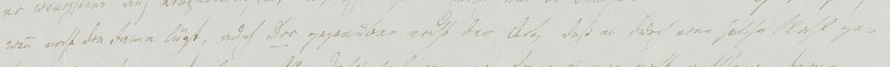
wenn nicht die Fama lügt, auch Dir gegenüber nicht der Art, daß es durch eine solche Wahl ge-
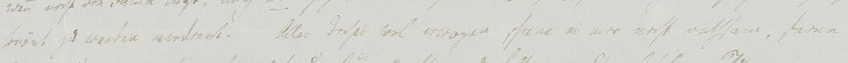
krönt zu werden verdient. Alles dieses wol erwogen schiene es mir nicht rathsam, seine
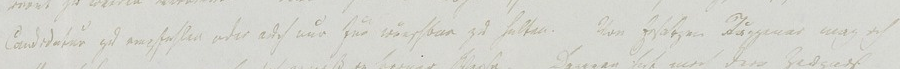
Candidatur zu empfehlen oder auch nur für wünschbar zu halten. Von Ersatzm. Tuggener mag ich
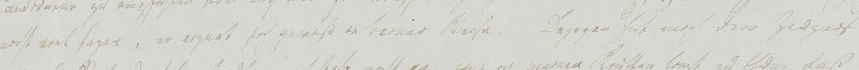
nicht viel sagen, er eignet sich gewiß in keiner Weise. Dagegen hat mich dein Zeugniß
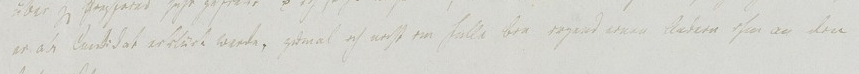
er als Candidat erklärt werde, zumal ich nicht im Falle bin irgend einen Andern ihm an die
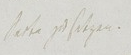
Seite zu setzen.
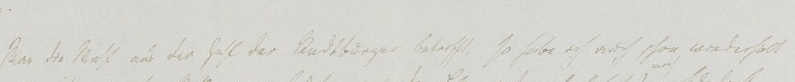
Was die Wahl aus der Zahl der Stadtbürger betrifft, so habe ich auch schon wiederholt
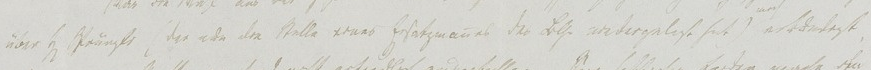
über Herrn Sprüngli (der nun die Stelle eines Ersatzmannes des BG. niedergelegt hat) mich erkundigt,
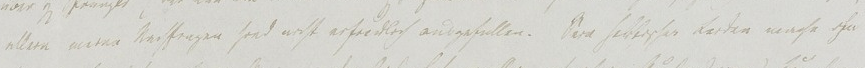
allein meine Nachfragen sind nicht erfreulich ausgefallen. Sein hektisches Leiden mache ihn
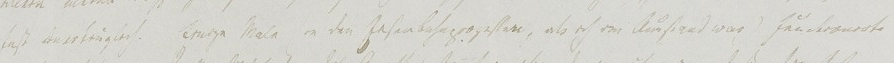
fast unerträglich. Einige Male (in den Eisenbahnprozessen, als ich im Ausstand war) functionirte
